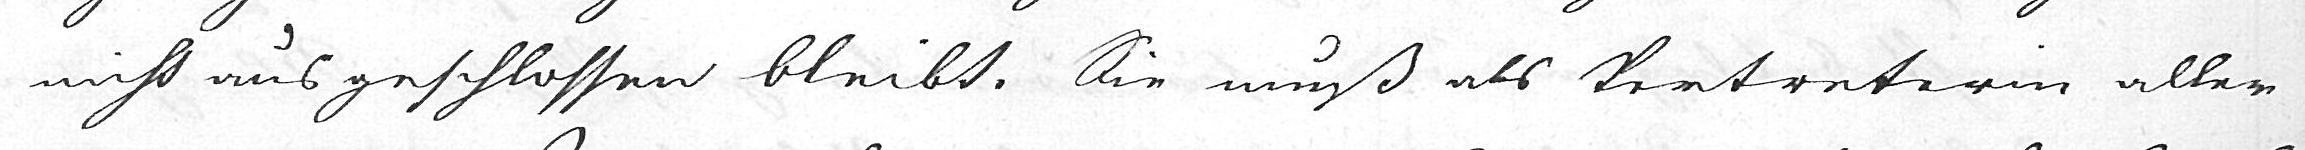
nicht ausgeschlossen bleibt. Sie muß als Vertreterin aller
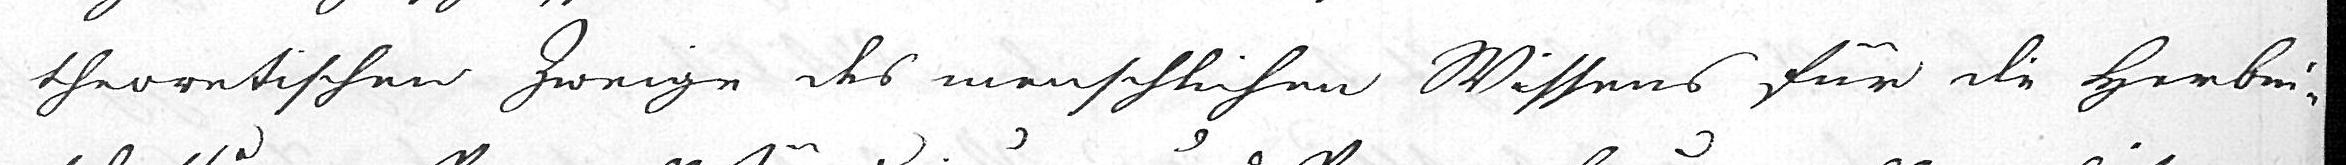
theoretischen Zweige des menschlichen Wissens für die Herbei-
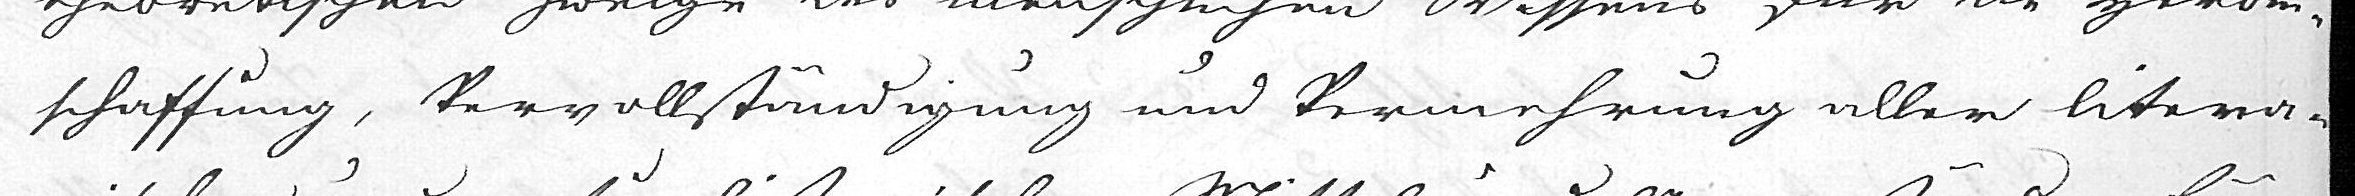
schaffung, Vervollständigung und Vermehrung aller litera-
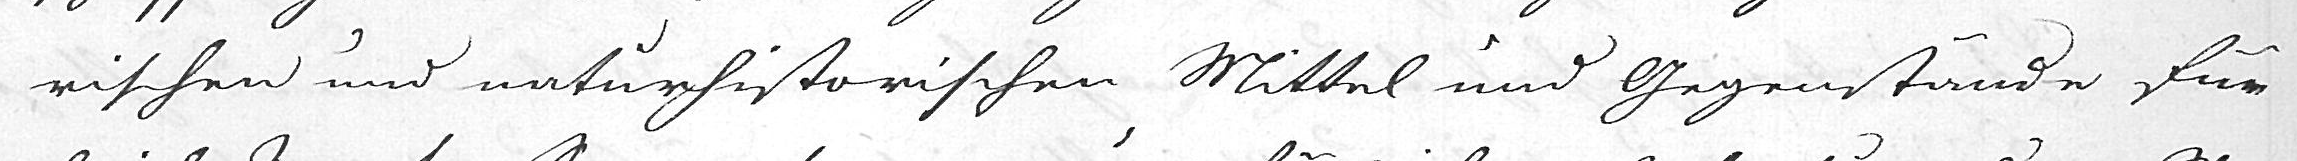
rischen und naturhistorischen Mittel und Gegenstände für
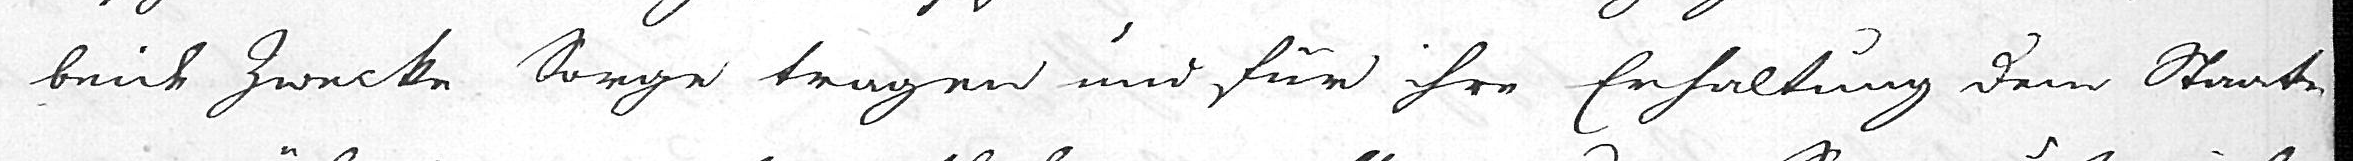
beide Zwecke Sorge tragen und für ihre Erhaltung dem Staate
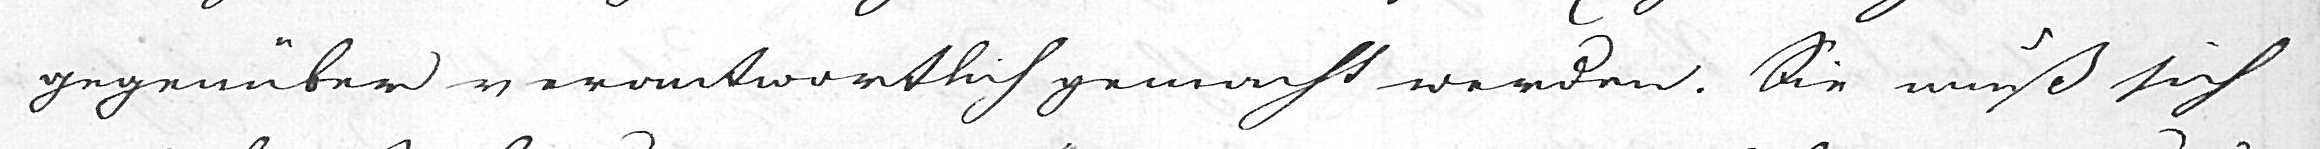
gegenüber verantwortlich gemacht werden. Sie muß sich
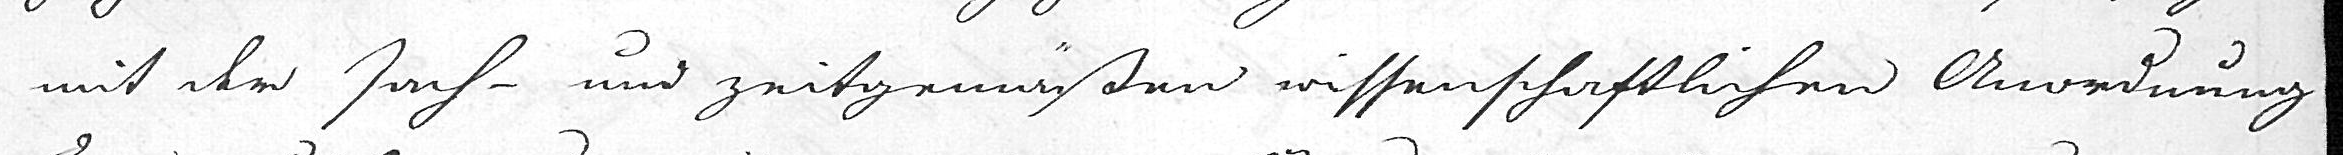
mit der sach- und zeitgemäßen wissenschaftlichen Anordnung
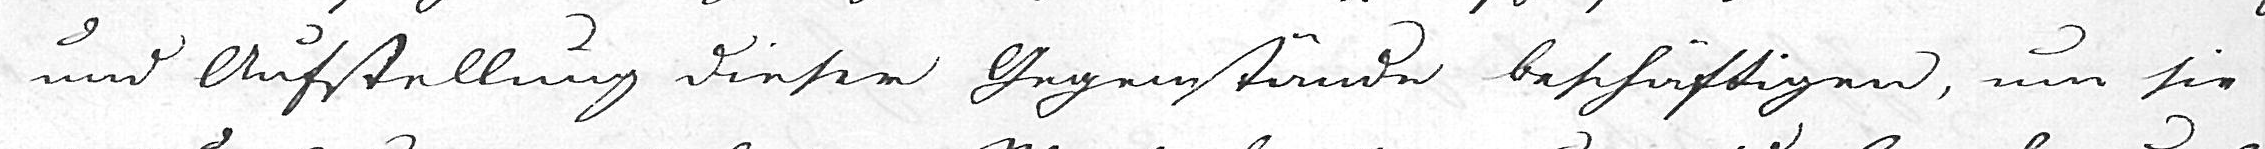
und Aufstellung dieser Gegenständen beschäftigen, um sie
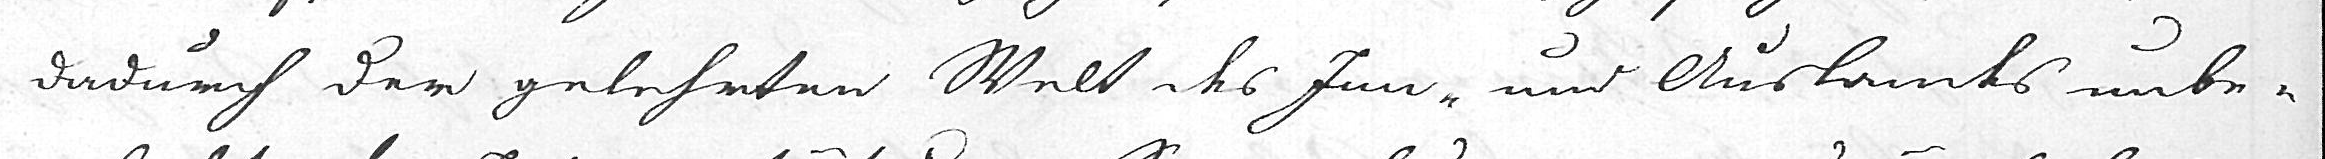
dadurch der gelehrten Welt des Inn- und Auslandes unbe-
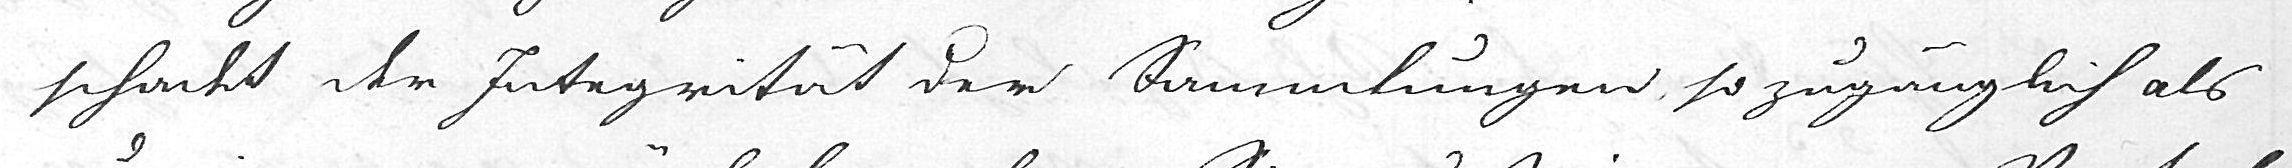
schadet der Integrität der Sammlungen so zugänglich als
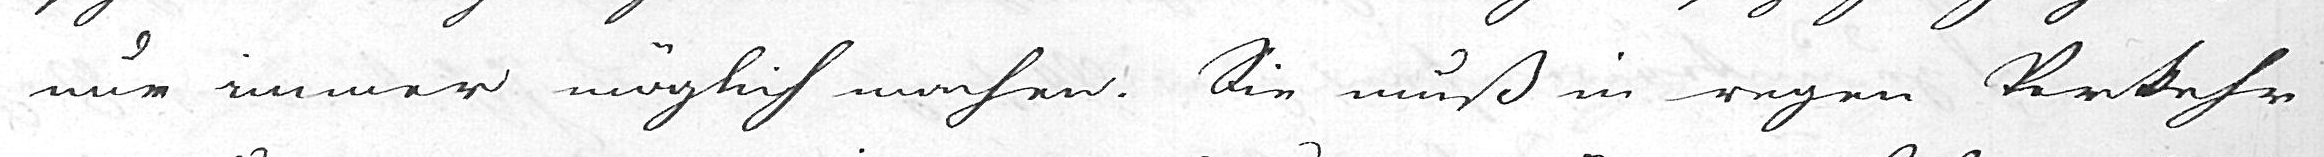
nur immer möglich machen. Sie muß in regen Verkehr
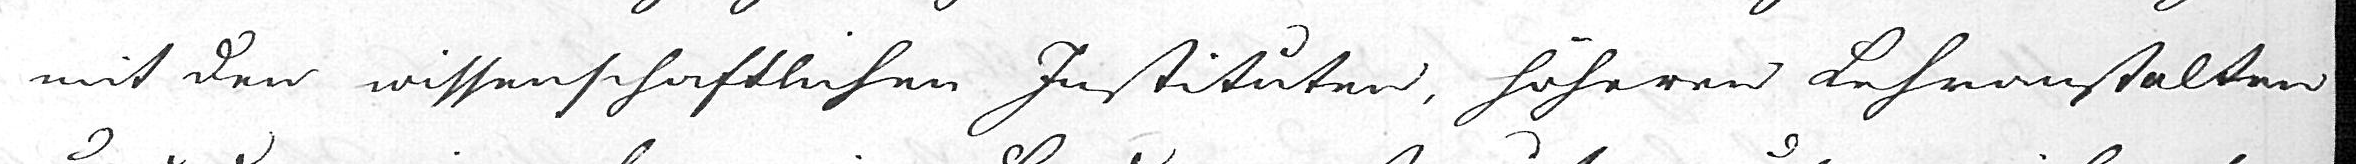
mit den wissenschaftlichen Instituten, höheren Lehranstalten
